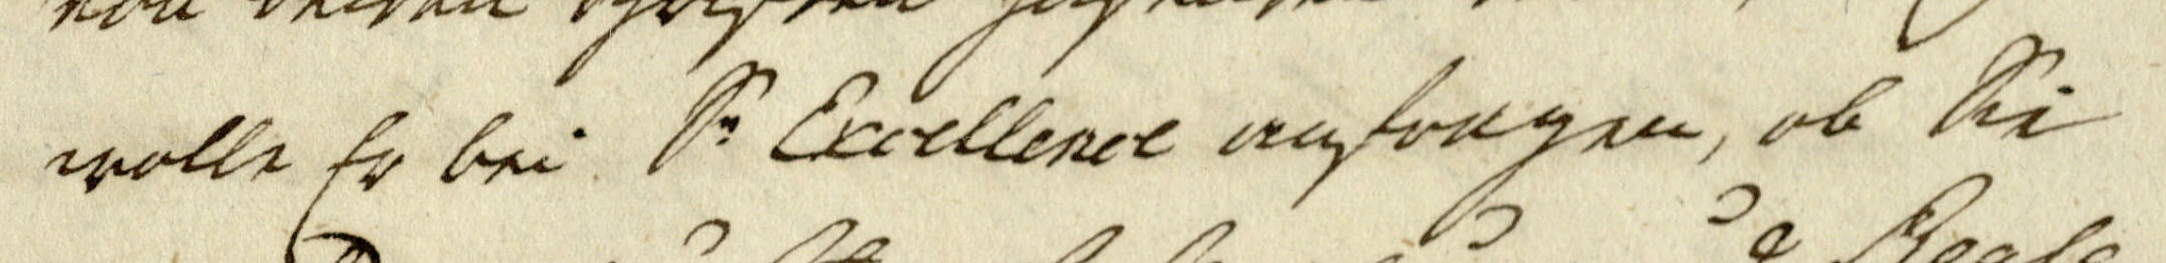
wolle Er bei Sr Excellence anfragen, ob Sie
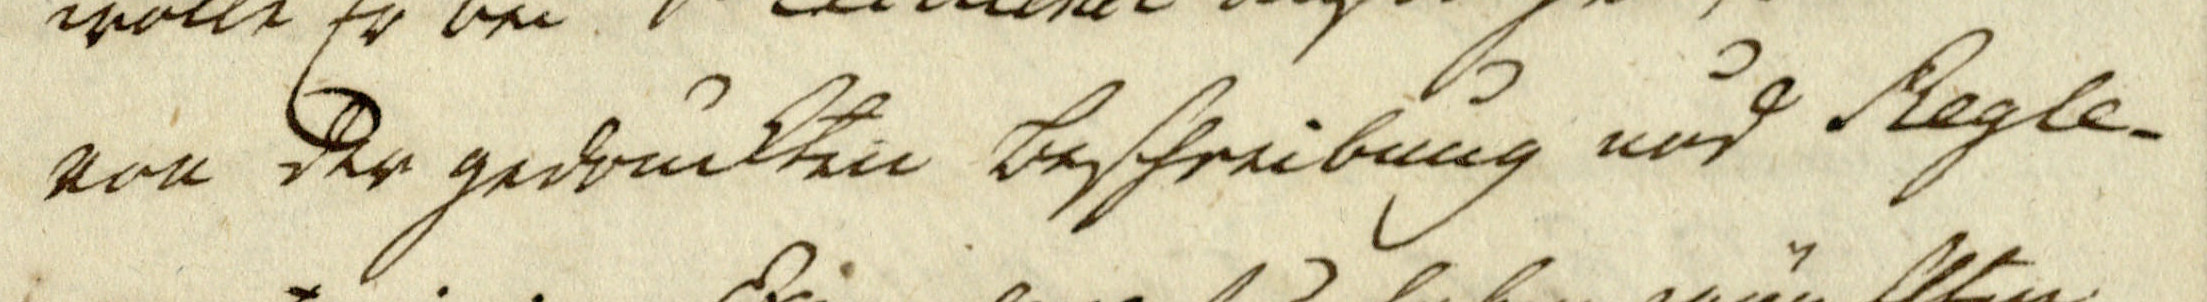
von der gedruckten Beschreibung und Regle¬
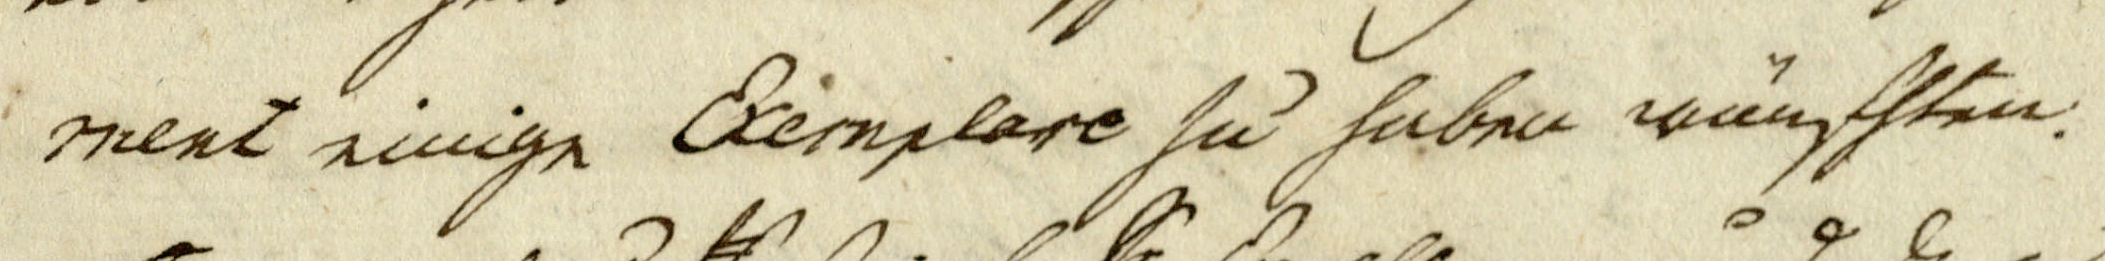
ment einige Exemplare zu haben wünschten.
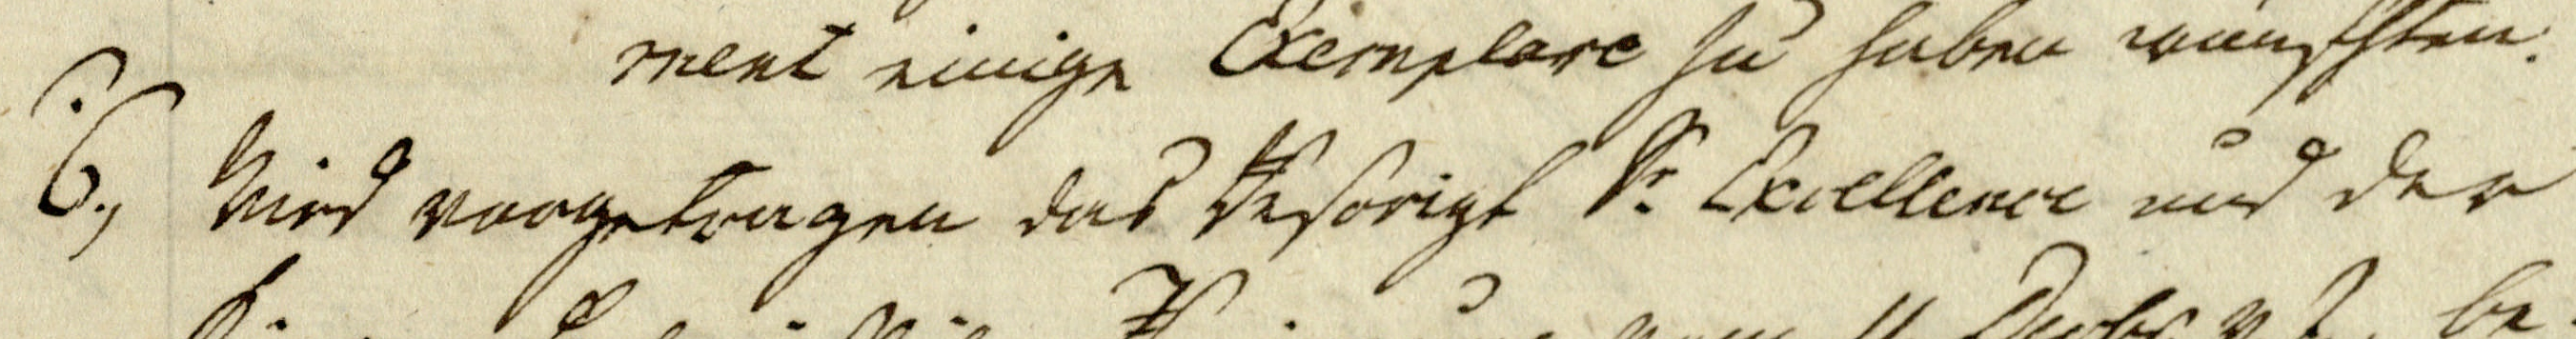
6., Wird vorgetragen das Rescript Sr Excellence und der
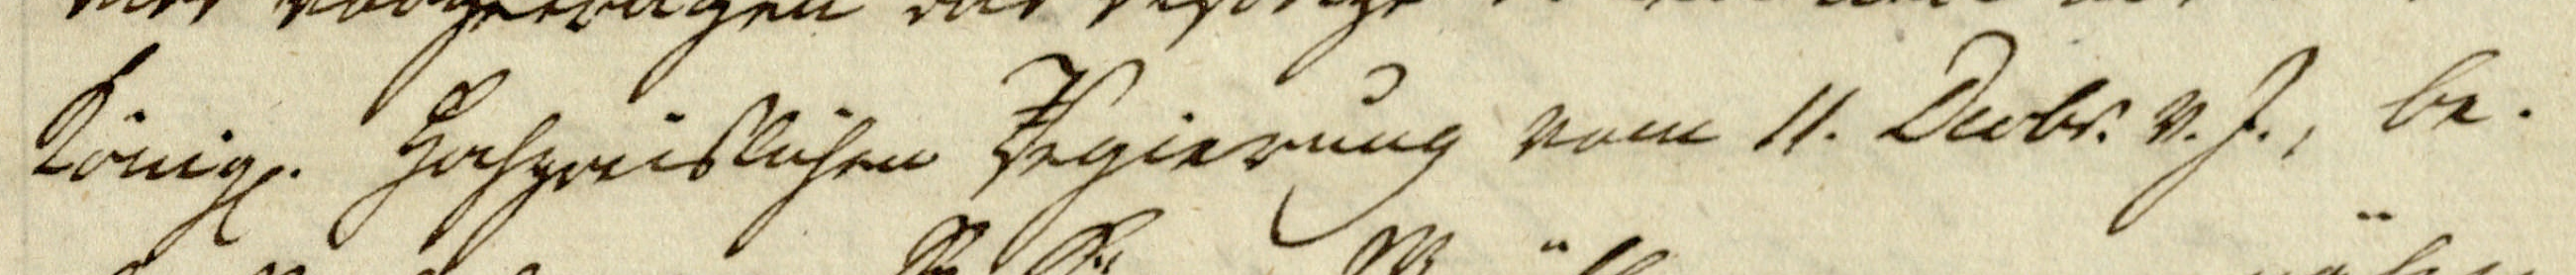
Königl. Hochpreislichen Regierung vom 11. Decbr v. J., be¬
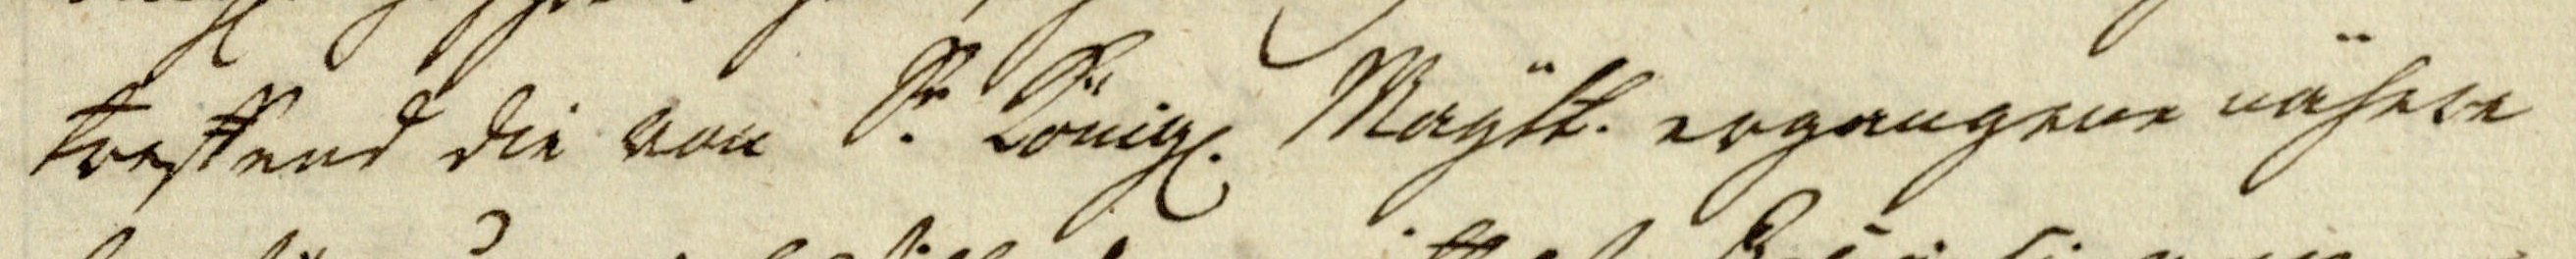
treffend die von Sr. Königl. Maÿtt. ergangene nähere
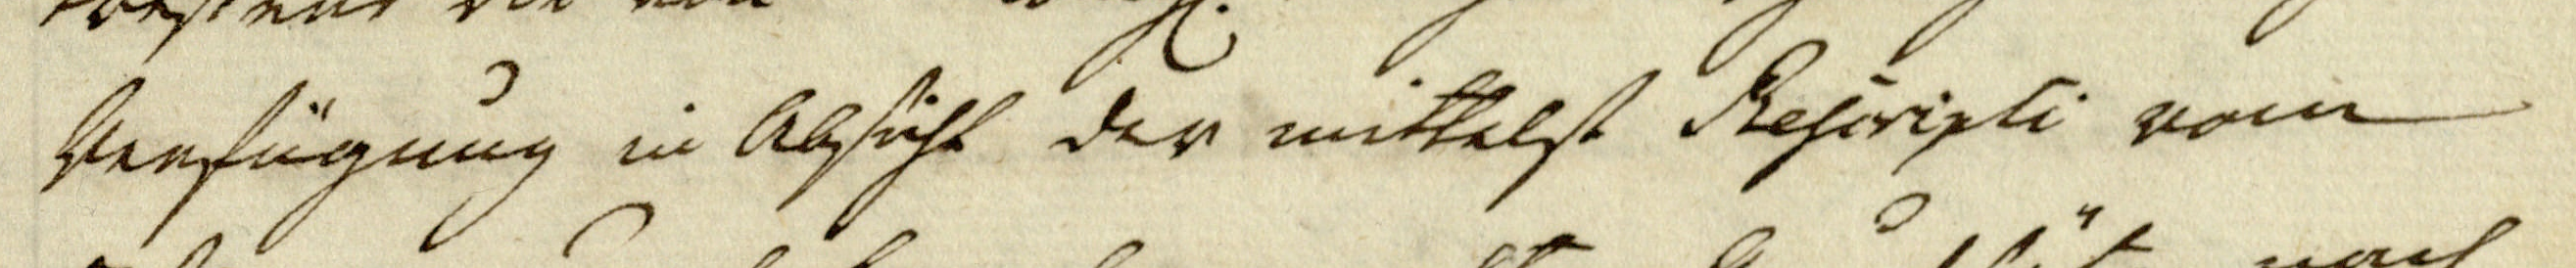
Verfügung in Absicht der mittelst Rescripti vom
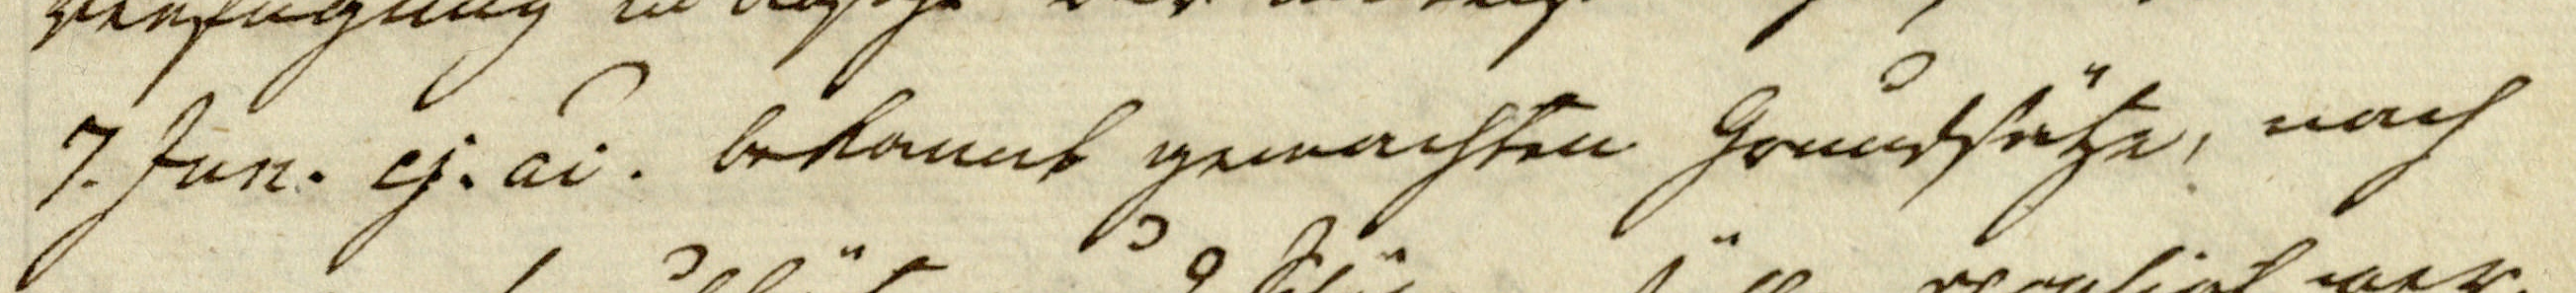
7. Jun. ej. ai. bekannt gemachten Grundsätze, nach
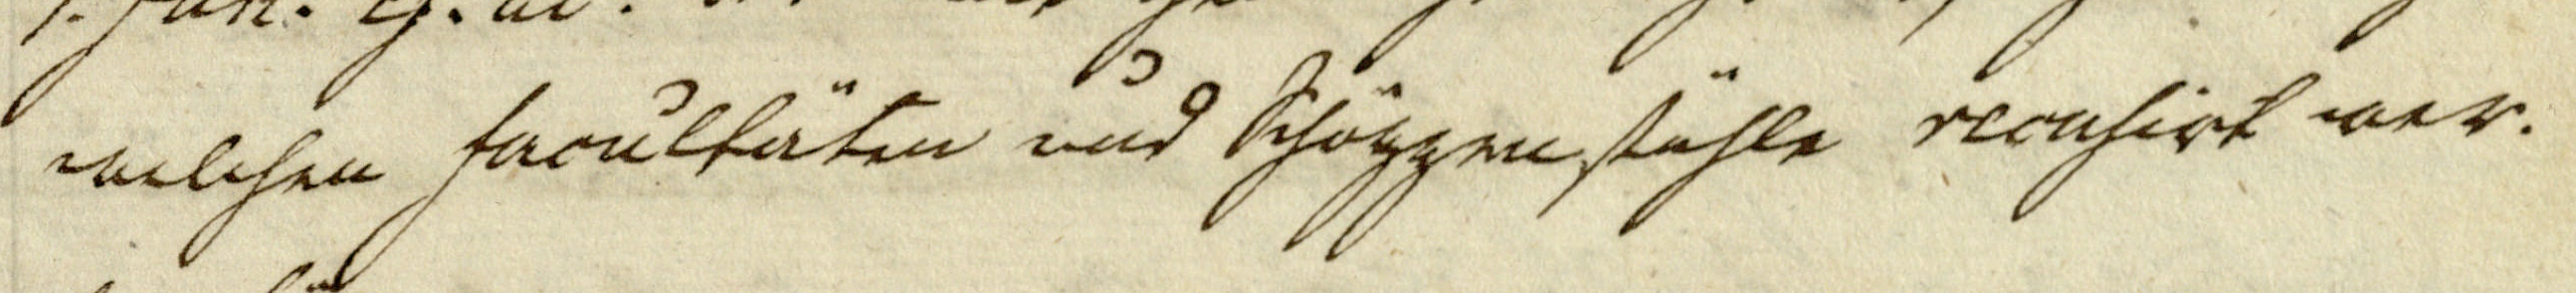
welchen Facultäten und Schöppenstühle recasirt wer¬
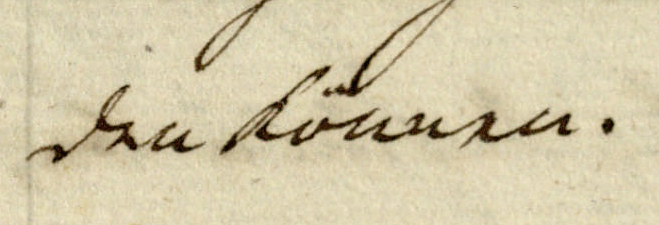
den können.
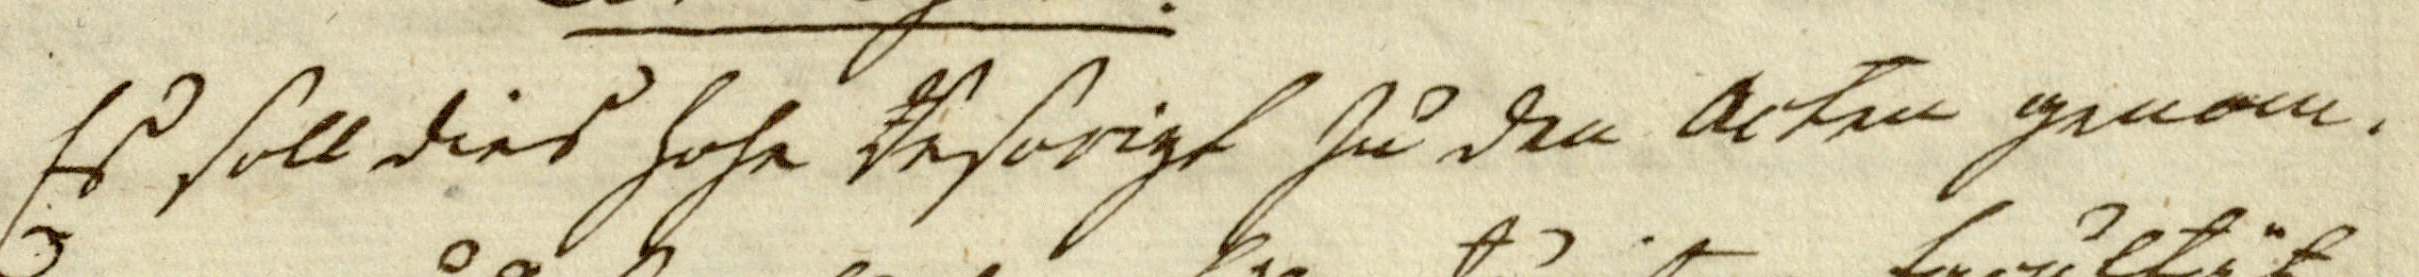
Es soll dies hohe Rescript zu den Acten gemom¬
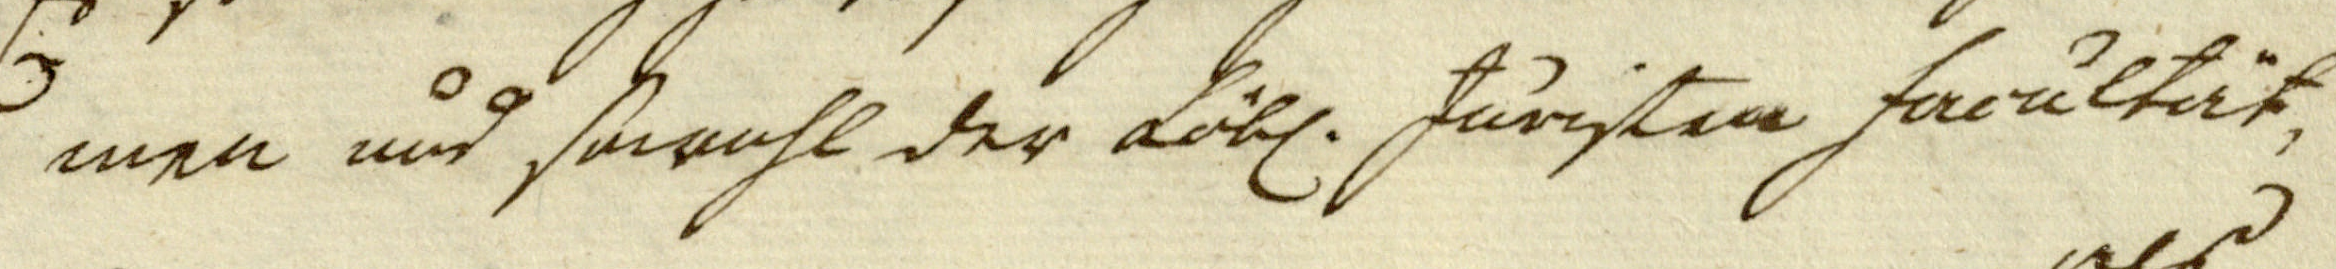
men und sowohl der Löbl. Juristen Facultät,
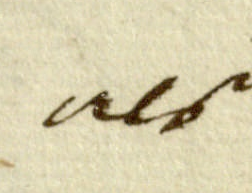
als
